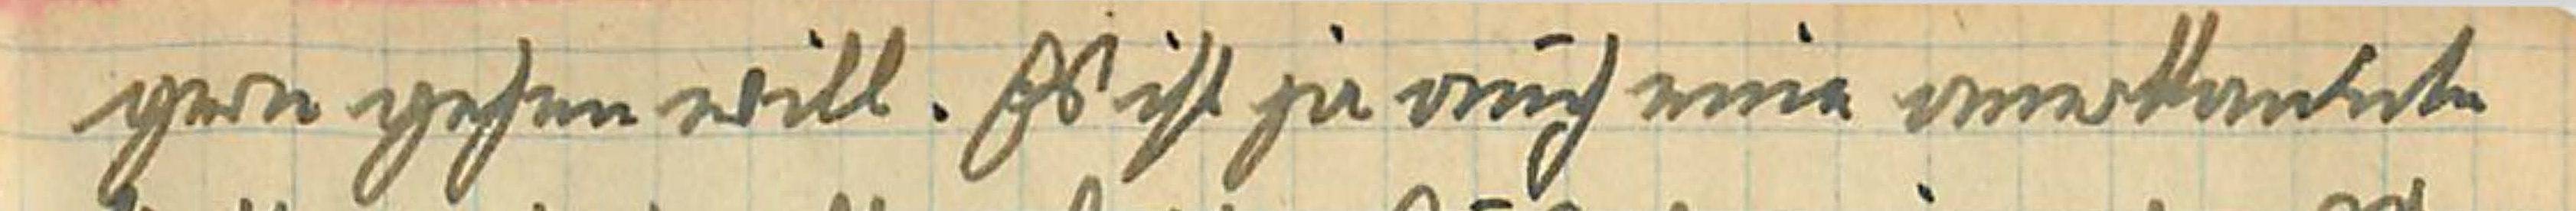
gern gehen will. Es ist ja auch eine anerkannte
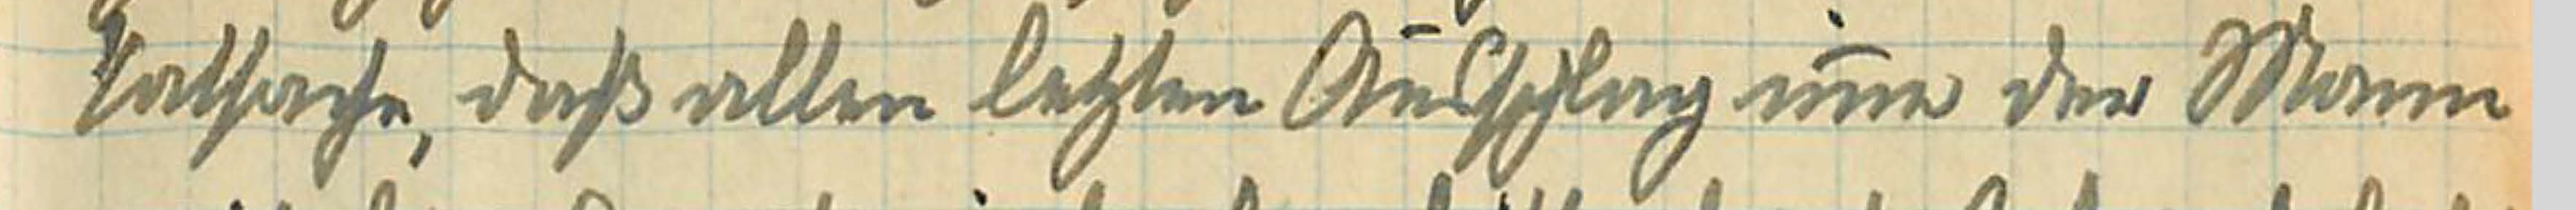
Tatsache, daß allen letzten Ausschlag immer der Mann
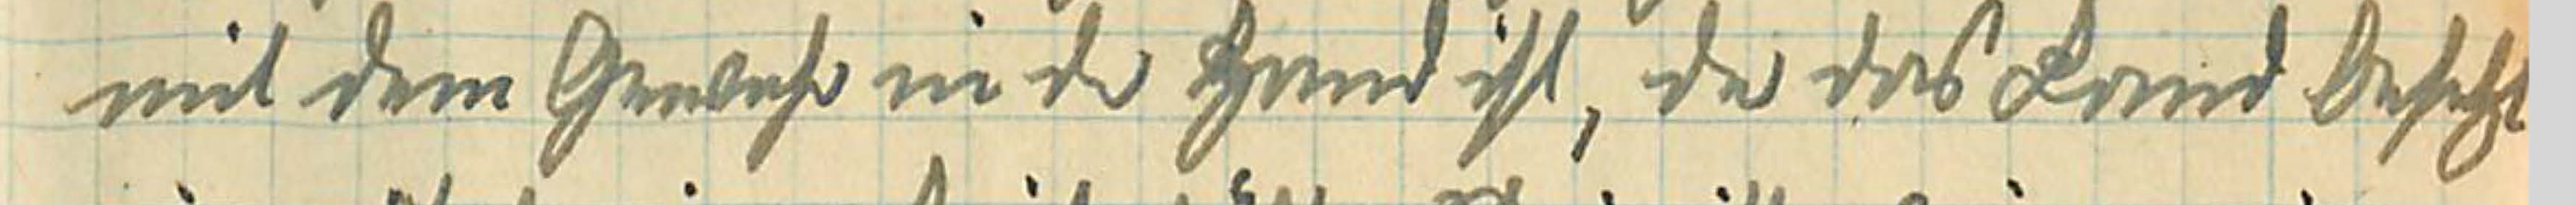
mit dem Gewehr in der Hand ist, der das Land besetzt
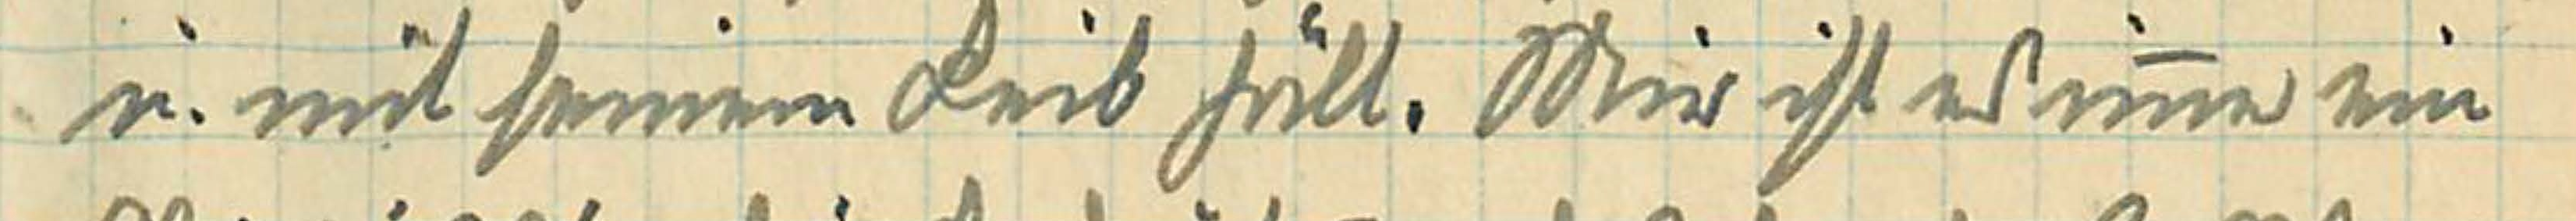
u. mit seinem Leib hält. Mir ist es immer ein
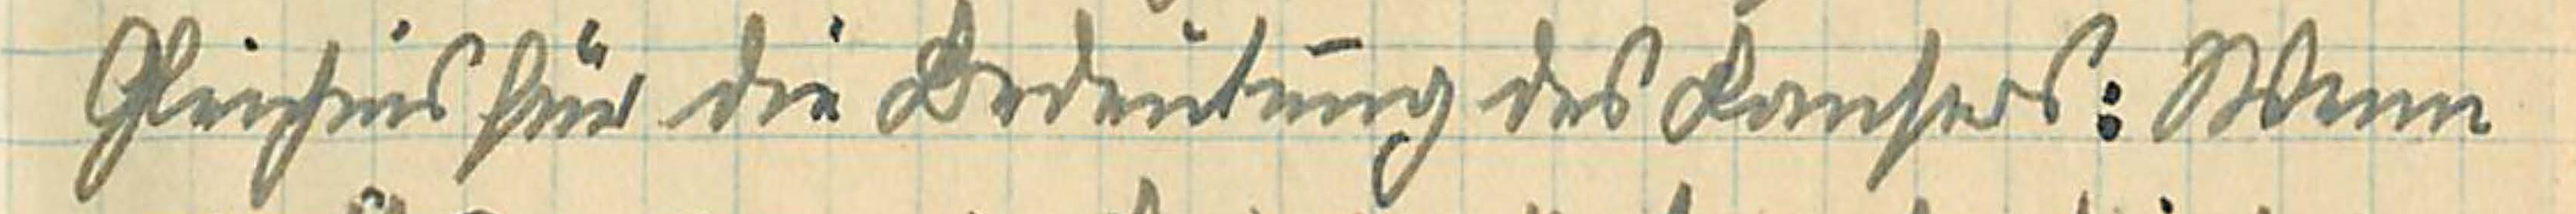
Gleichnis für die Bedeutung des Lansers: Wenn
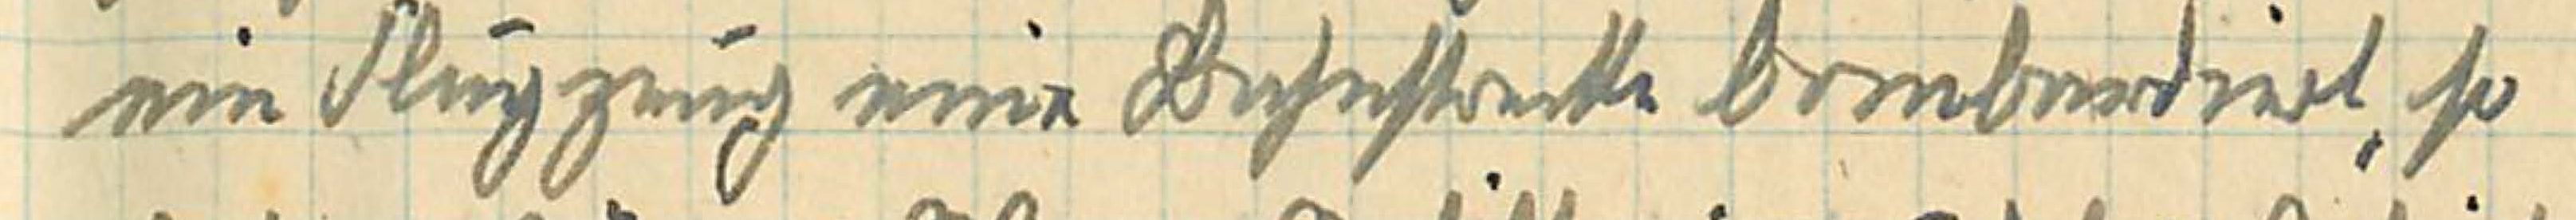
ein Flugzeug eine Bahnstrecke bombardiert, so
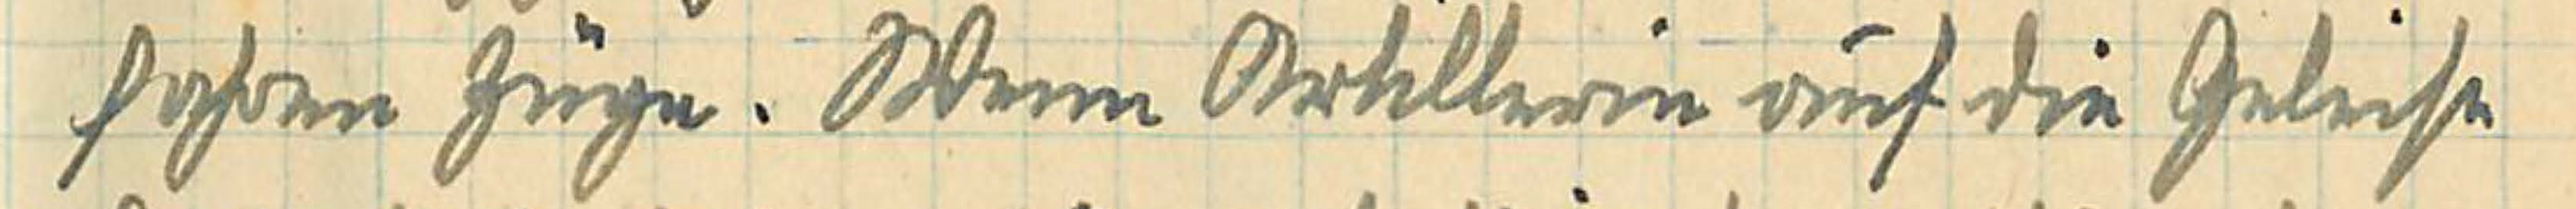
fahren Züge. Wenn Artillerie auf die Geleise
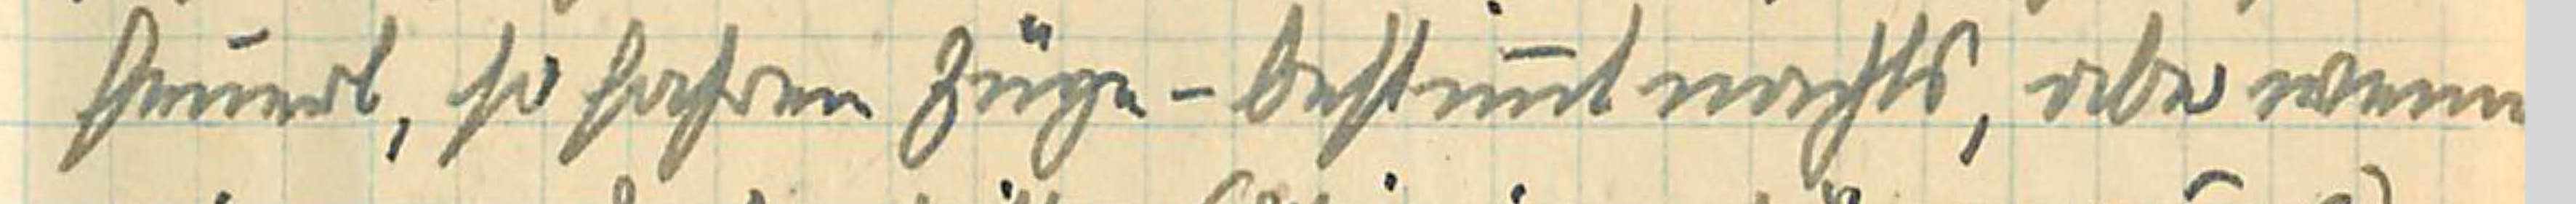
feuert, so fahren Züge – bestimmt nachts, aber wenn
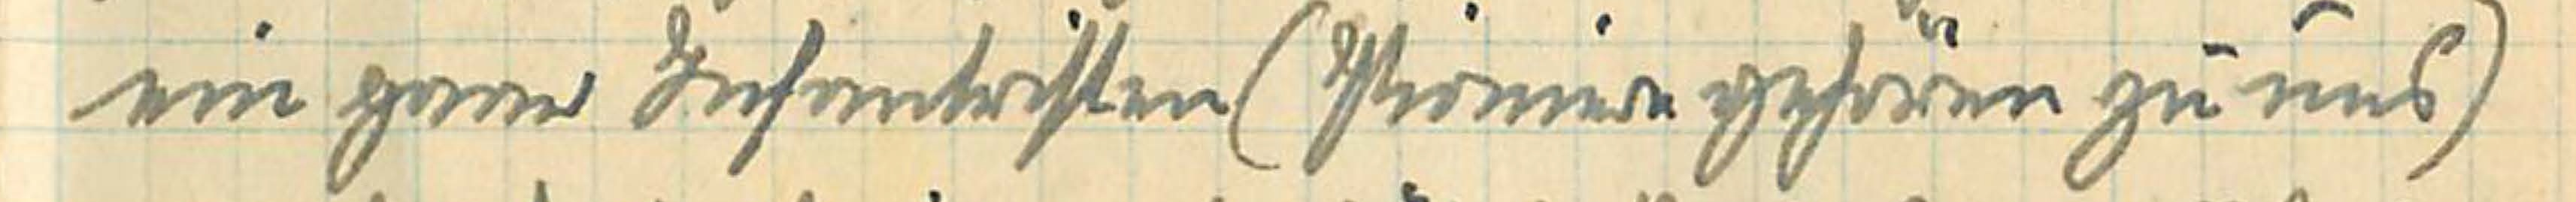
ein paar Infantristen (Pioniere gehören zu uns)
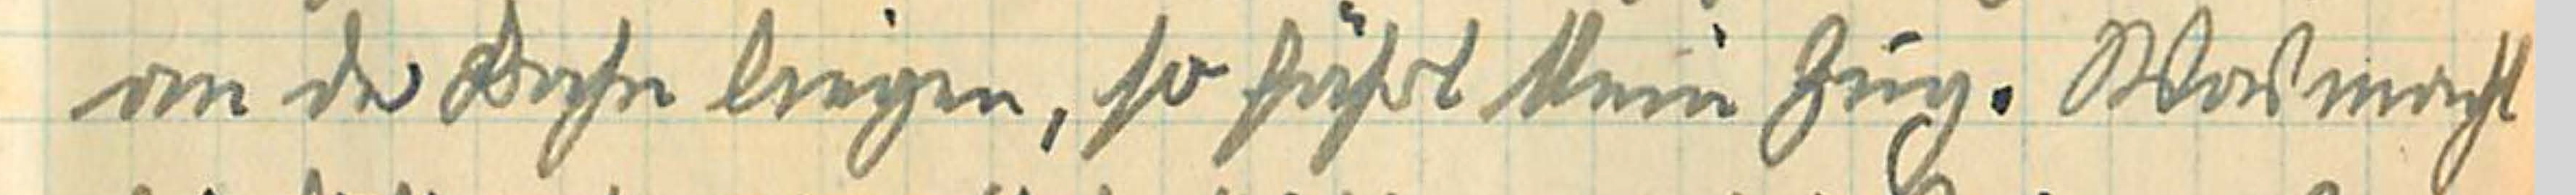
an der Bahn liegen, so fährt kein Zug. Was macht
